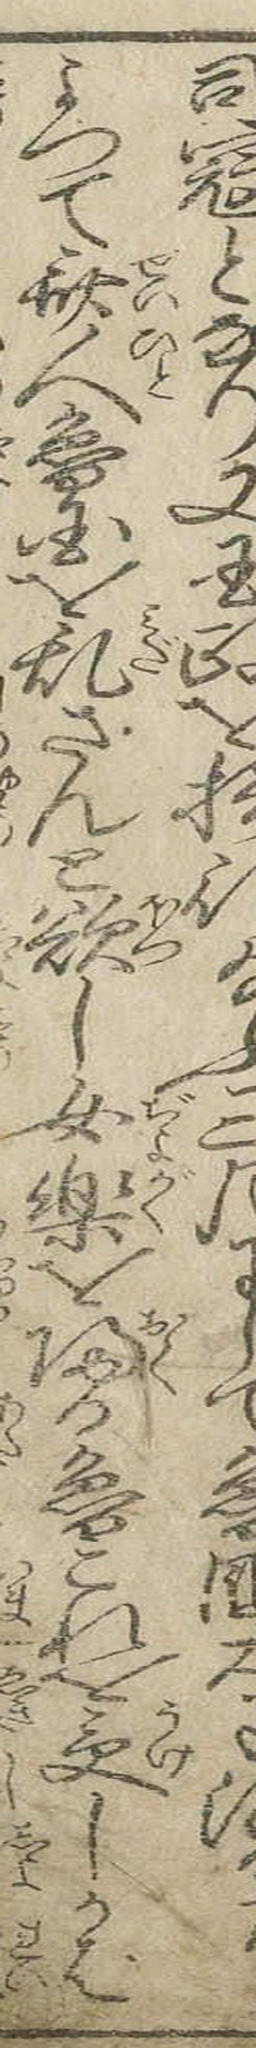よつて斉人魯国を乱さんと欲し女楽を帰る魯これを受しかば
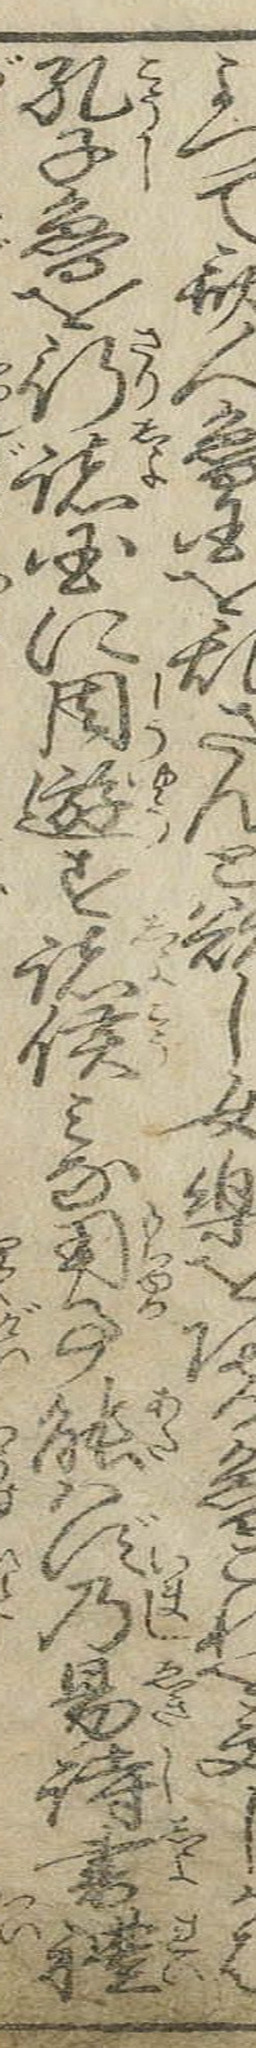孔子魯を行諸国に周遊す諸侯みな用事能はず乃易詩書礼
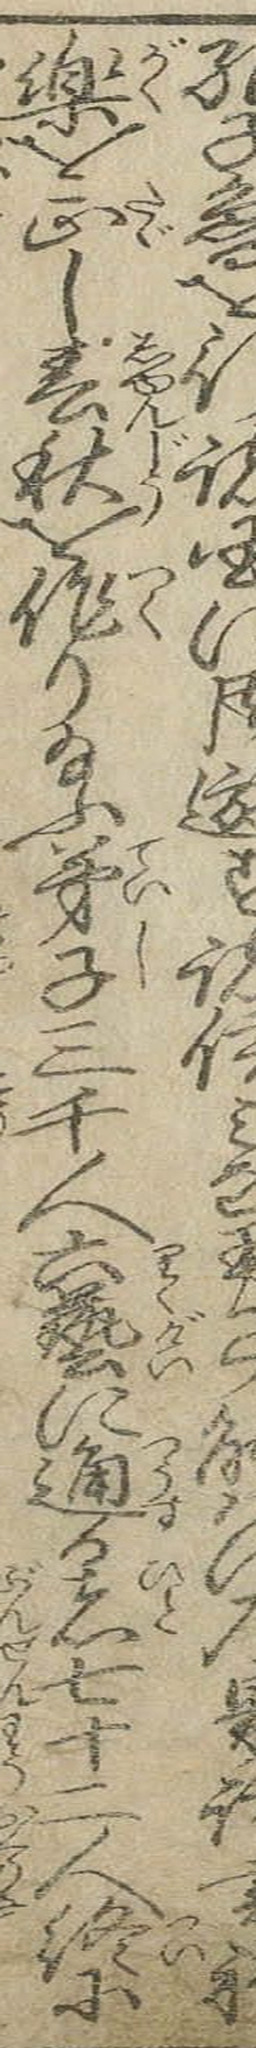楽を正し春秋を作り給ふ弟子三千人六芸に通る者七十二人終に
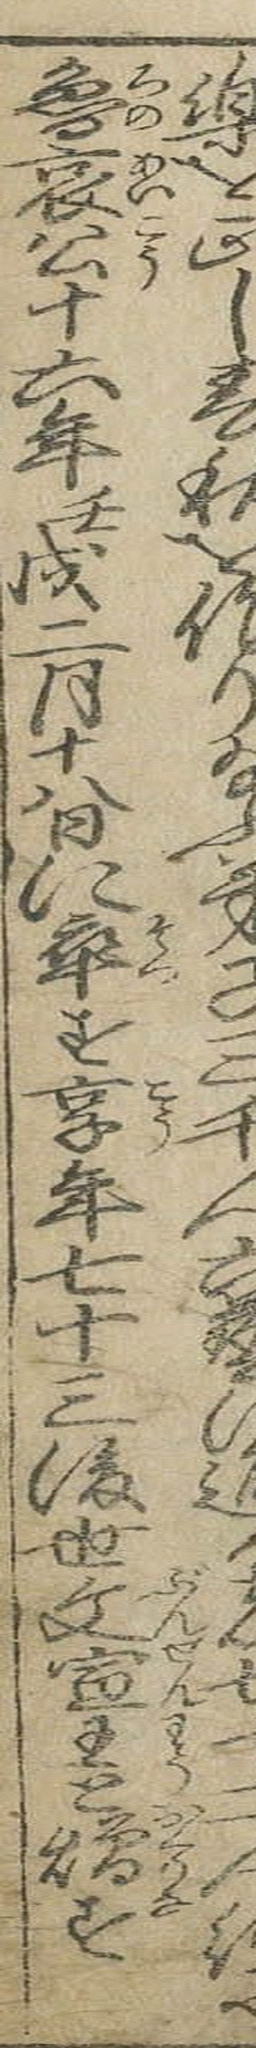魯哀公十六年壬戌二月十八日に卒す享年七十三後世文宣王と贈す

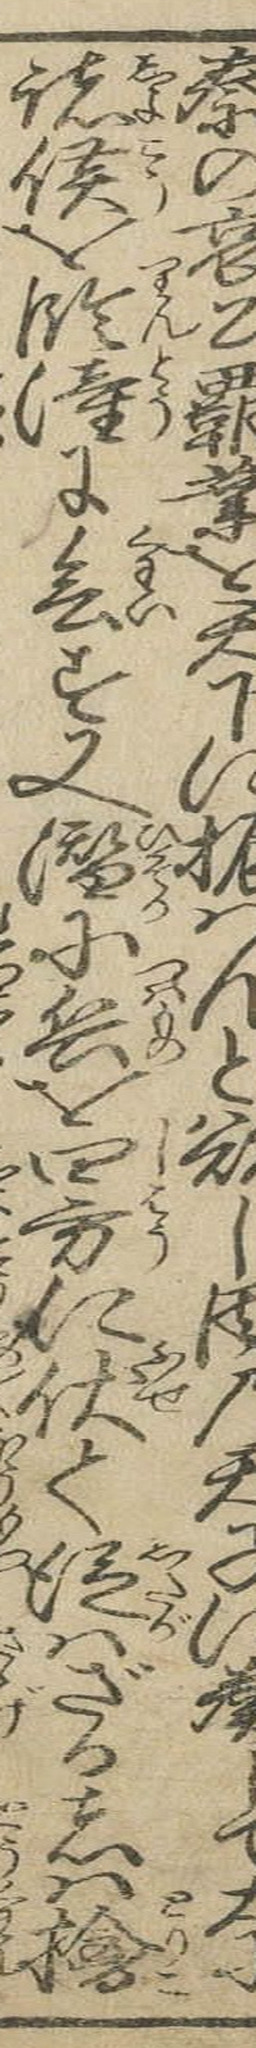諸侯を臨潼に会す又潜に兵を四方に伏て従はざる者は擒
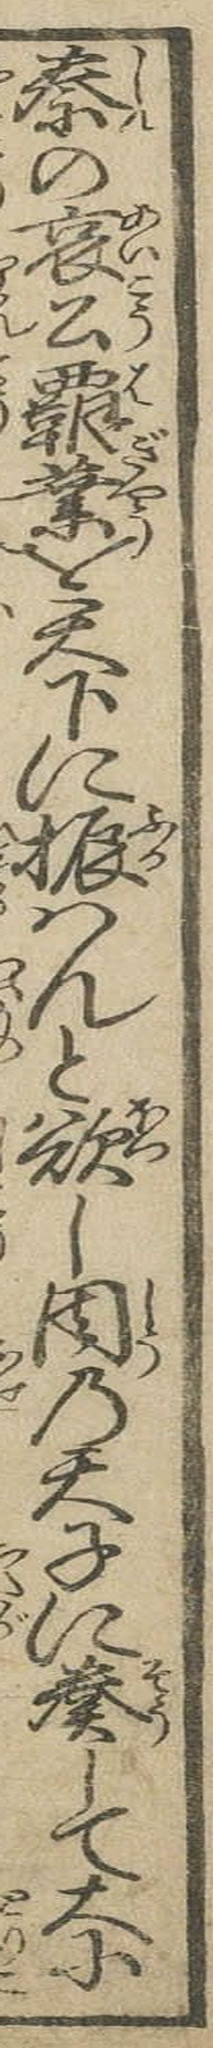秦の哀公覇業を天下に振はんと欲し周の天子に奏して大に
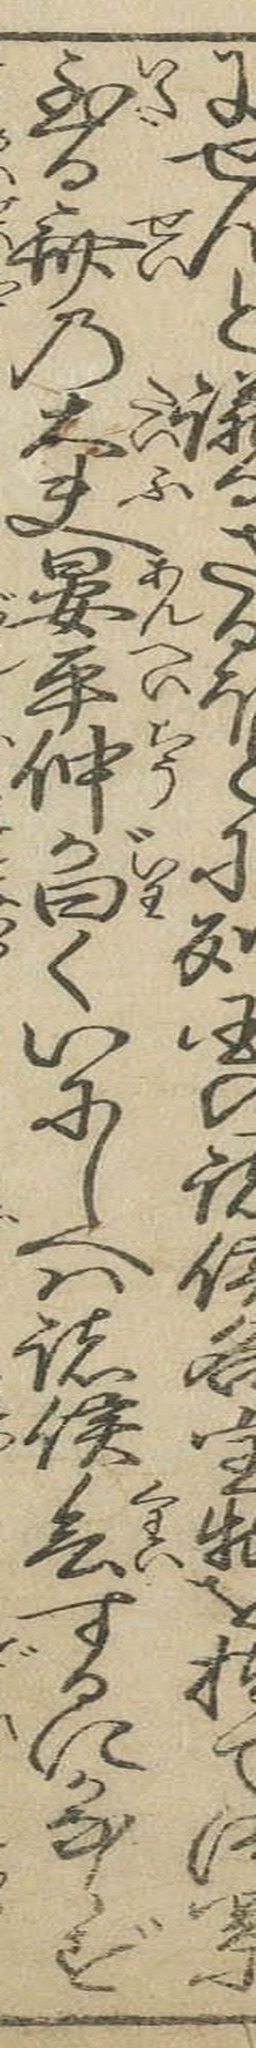至る斉の大夫晏平仲が曰くいにしへは諸侯会するにかならず
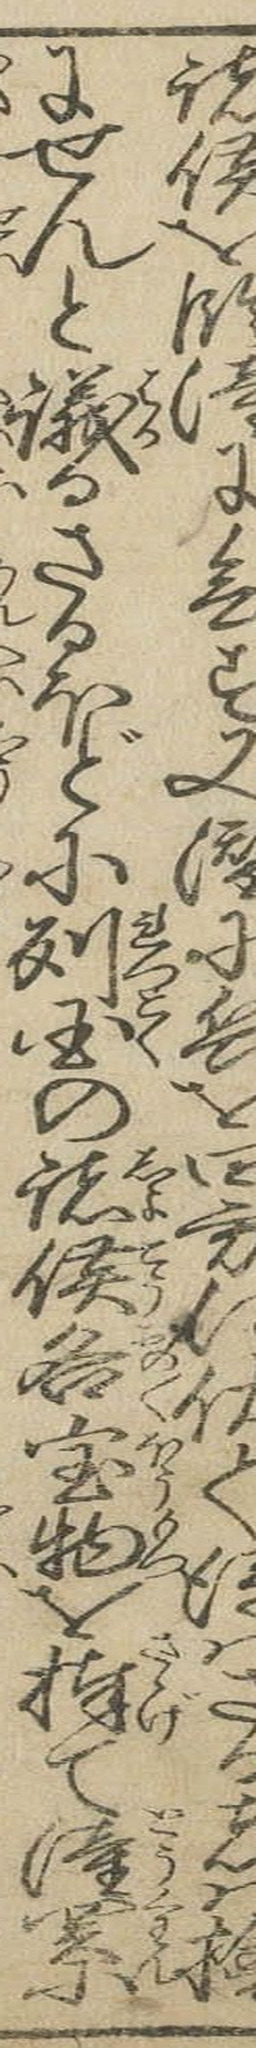にせんと議るさるほどに列国の諸侯各宝物を捧て潼関に
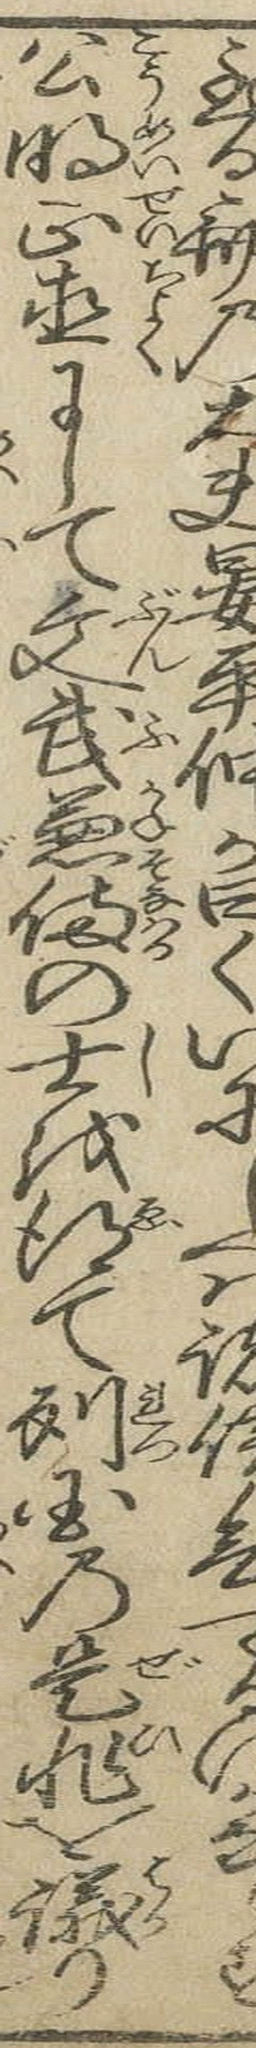公明正直にして文武兼備の士を得て列国の是非を議り
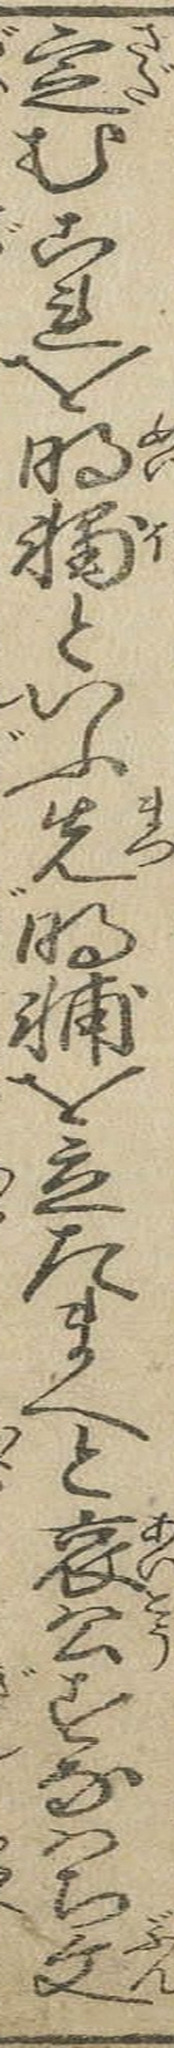定むこれを明輔といふ先明輔を立たまへと哀公すなはち文
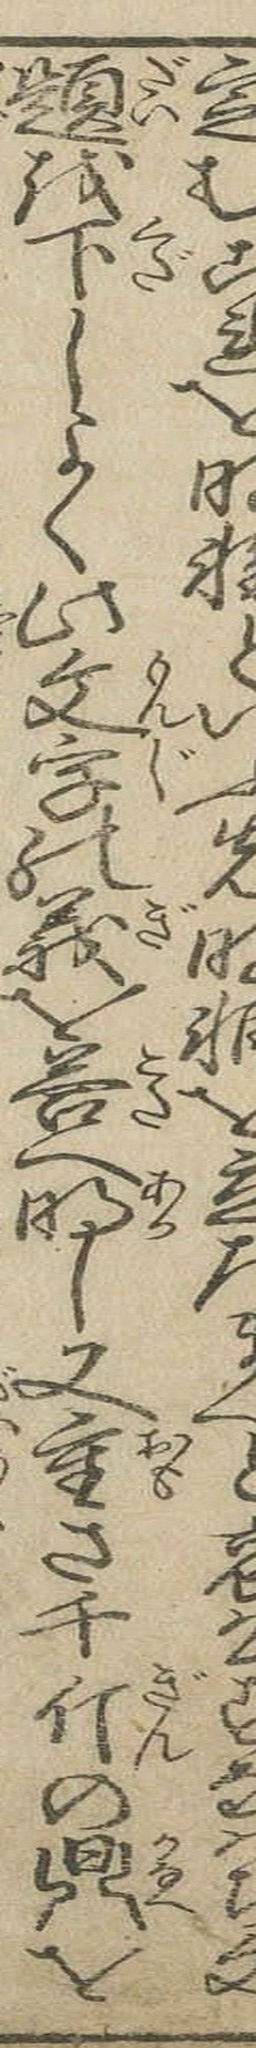題を下しよく此文字の義を答へ明し又重さ千斤の鼎を
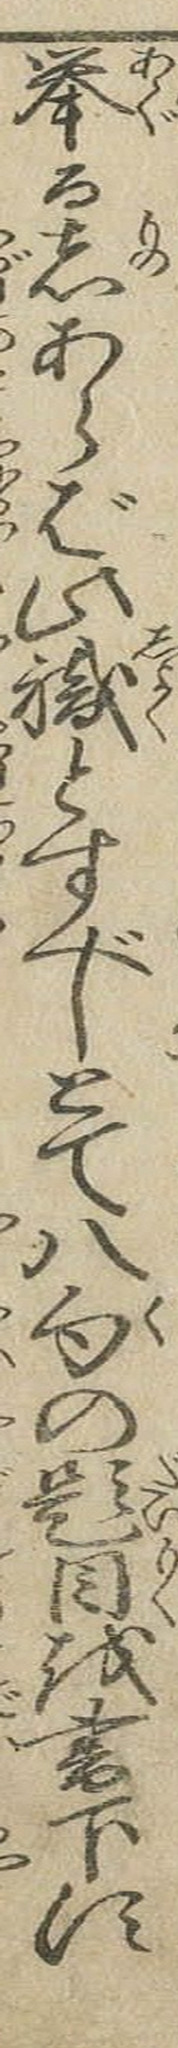挙る者あらば此職とすべしとて八句の題目を書下す
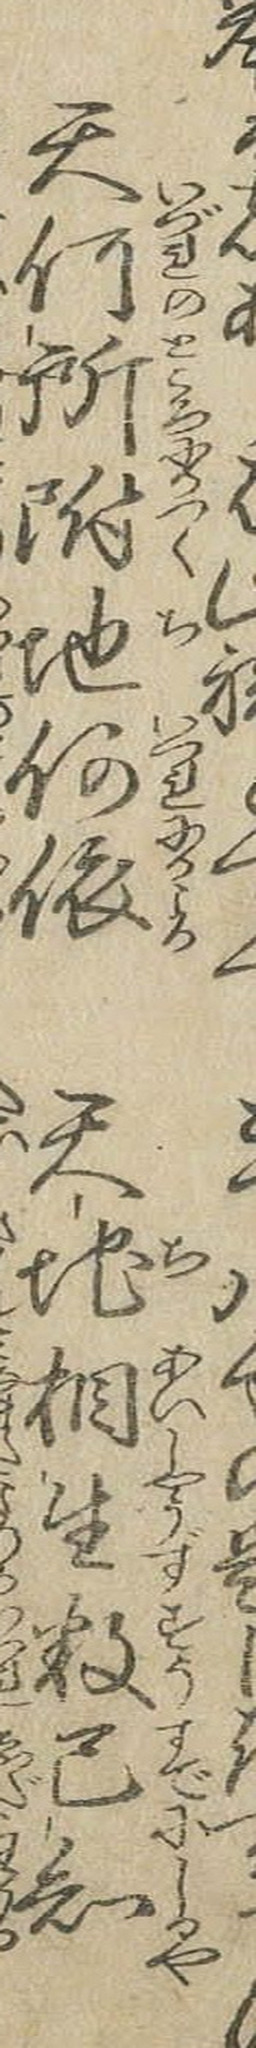天何-所付地何依天-地相生数已-知
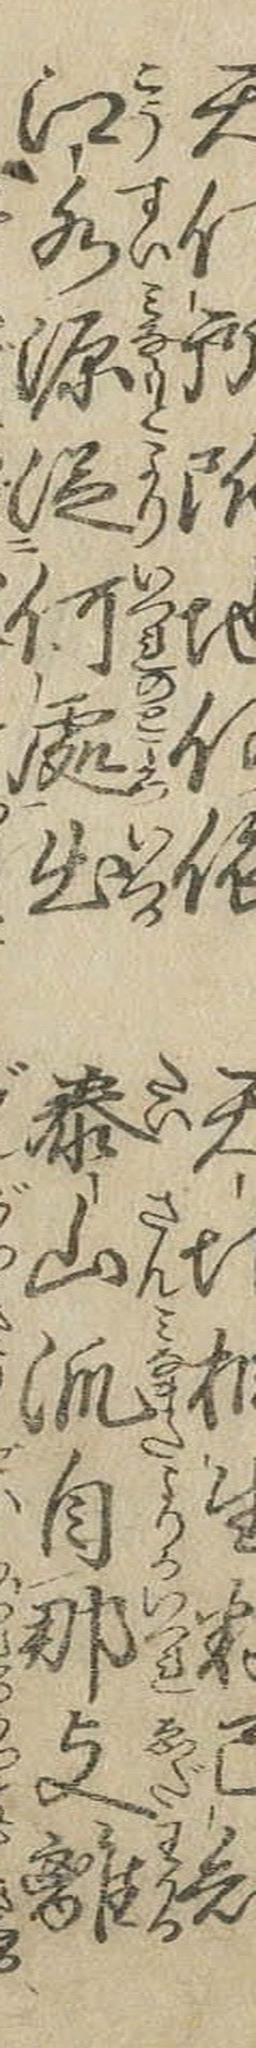江-水源従何-処出泰-山派自那支離
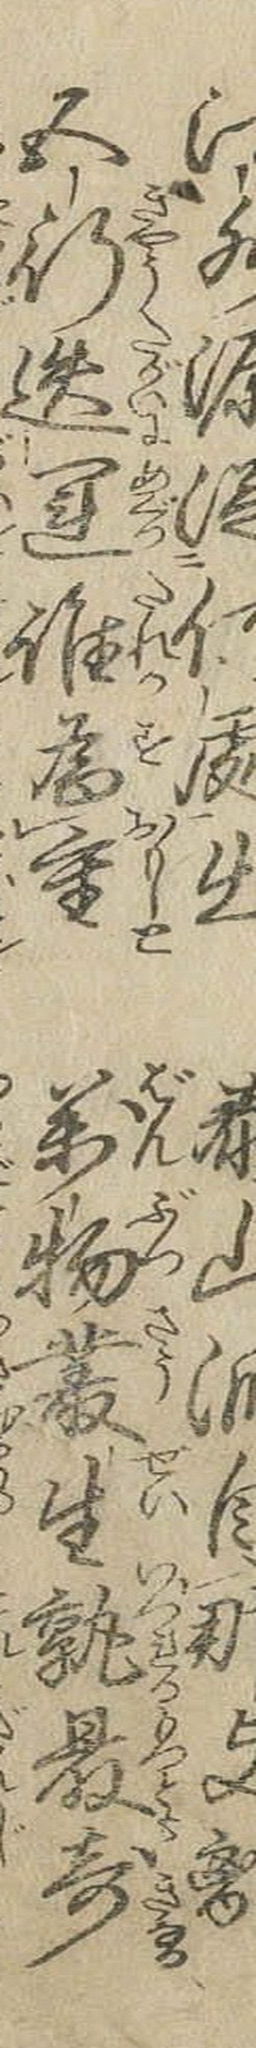五-行迭-運誰為重万-物叢-生孰最奇
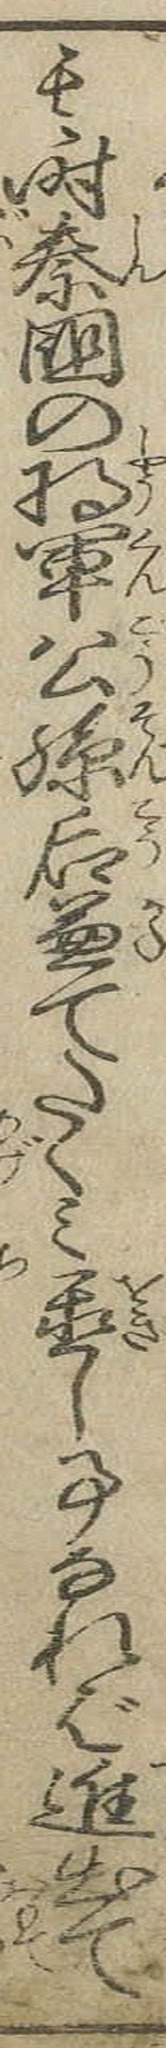其時秦国の将軍公孫后兼てたゝみ置し事なれば進出て
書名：絵本写宝袋 9巻 5之巻
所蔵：東京学芸大学教育コンテンツアーカイブ
